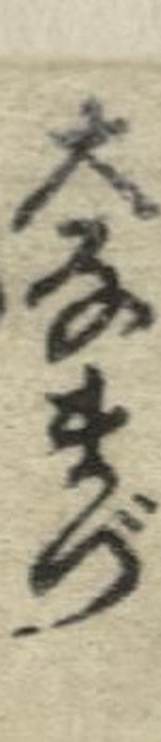大なまづ
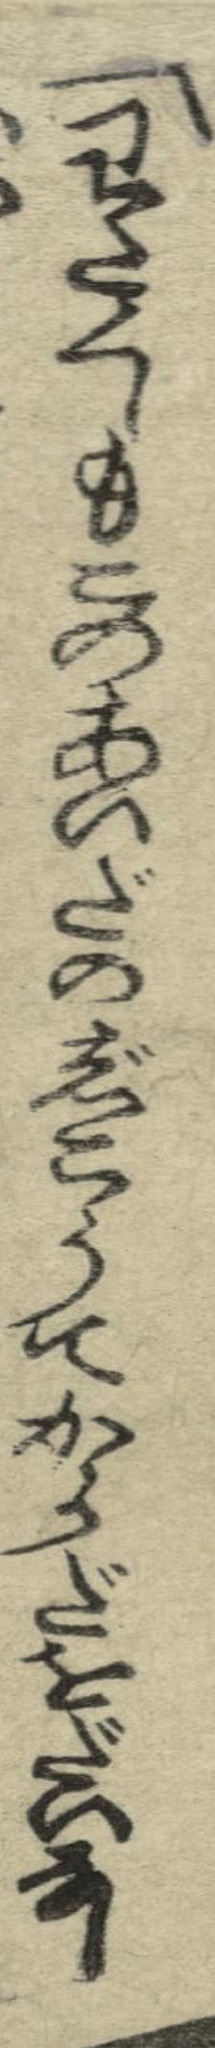〽わたくしもこのあいだのじこうてからだをだいなし
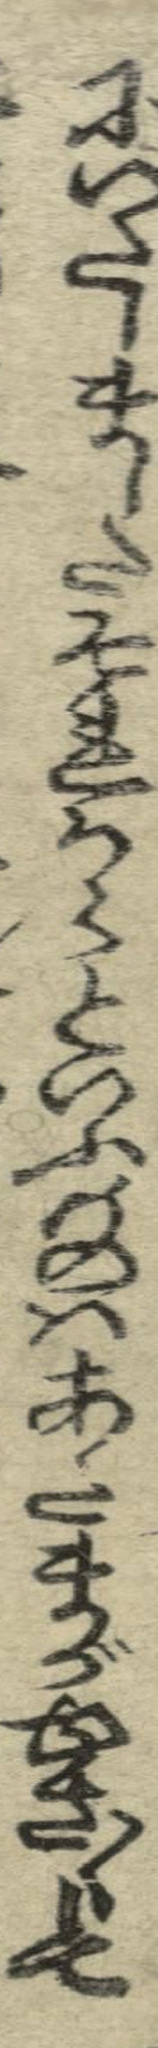にいたしましたそれからといふものはあたまがゆさ〳〵して
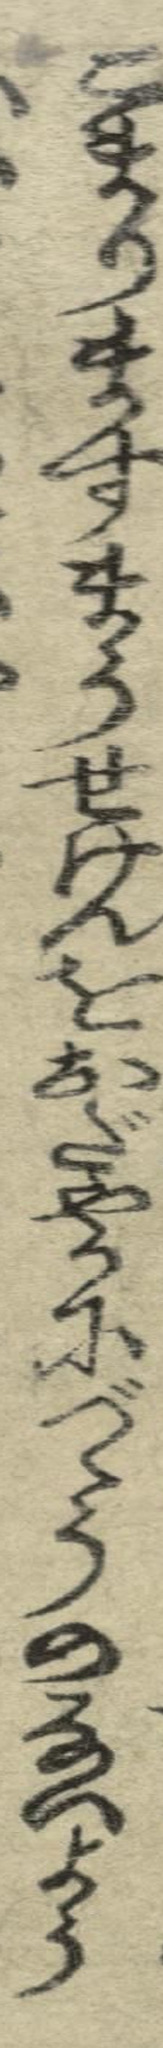こまりますまうせけんをおだやかにづゝうのないよう
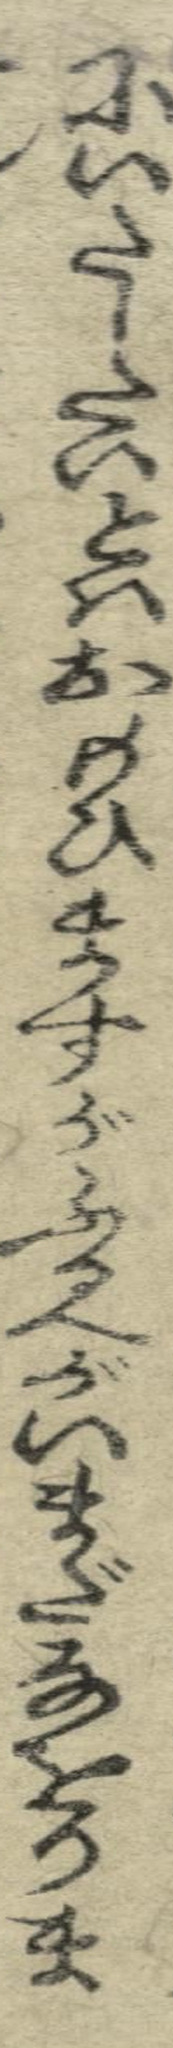にいたしたいとはおもひますがふるへがいまだなをりま
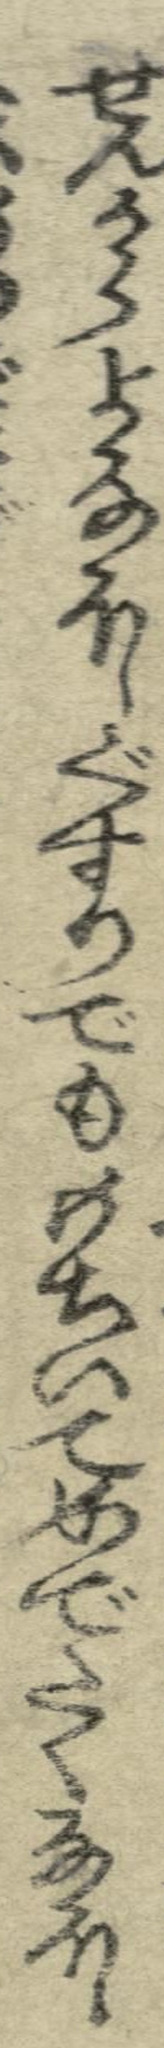せんからよなほしぐすりでももちいてめでたくなほし
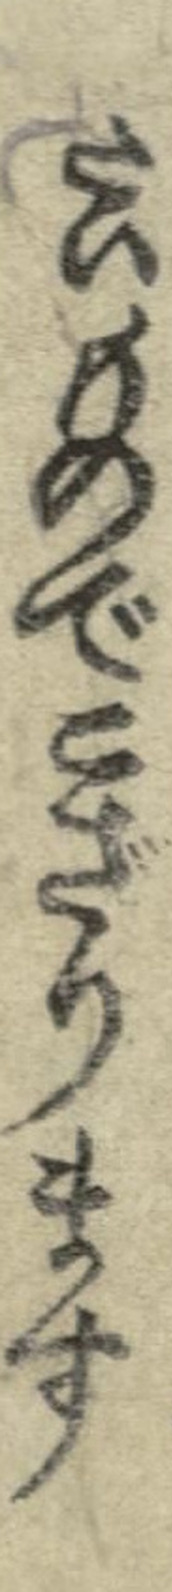たいものでこざります
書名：[鯰への見舞い]
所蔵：東京大学地震研究所図書室 Earthquake Research Institute Library, The University of Tokyo, JAPAN
